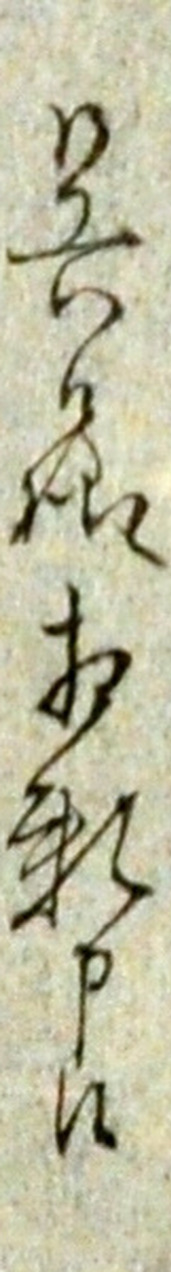呉候様相頼申候
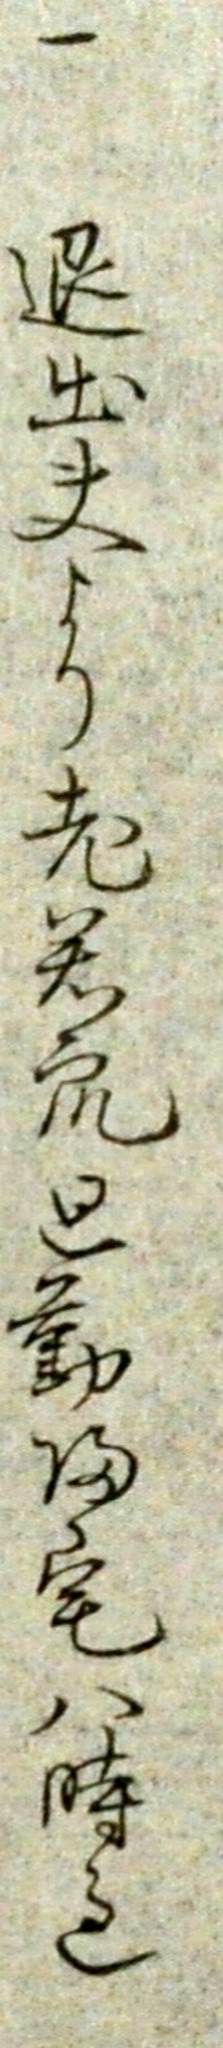一退出夫より老若衆廻勤帰宅八時過
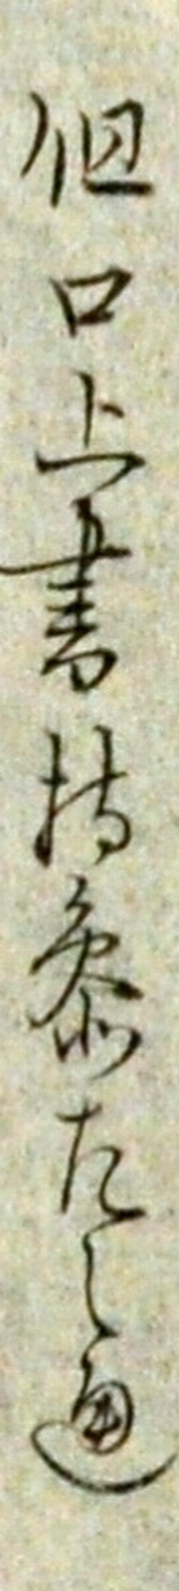但口上書持参左之通
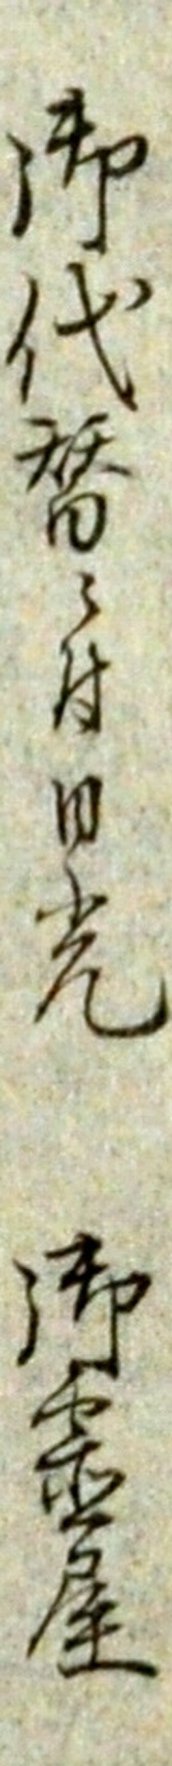御代替ニ付日光御霊屋
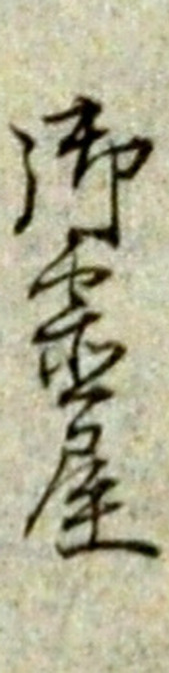御霊屋
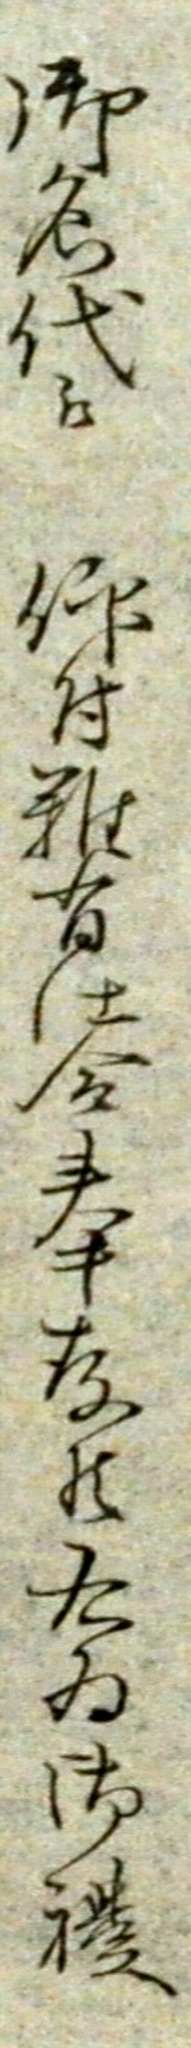御名代被仰付難有仕合奉存候右為御礼
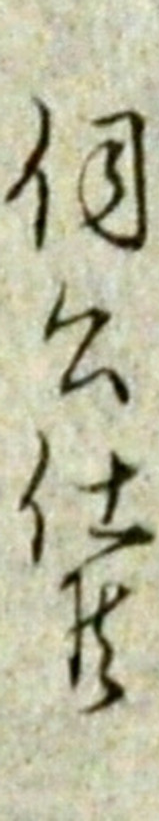伺公仕候

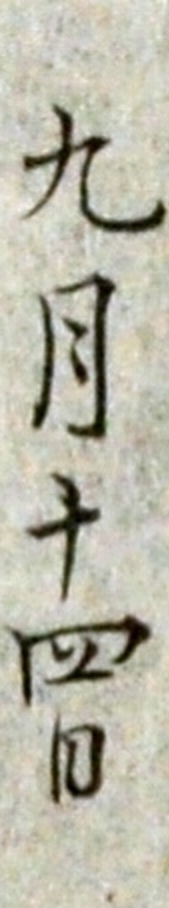九月十四日
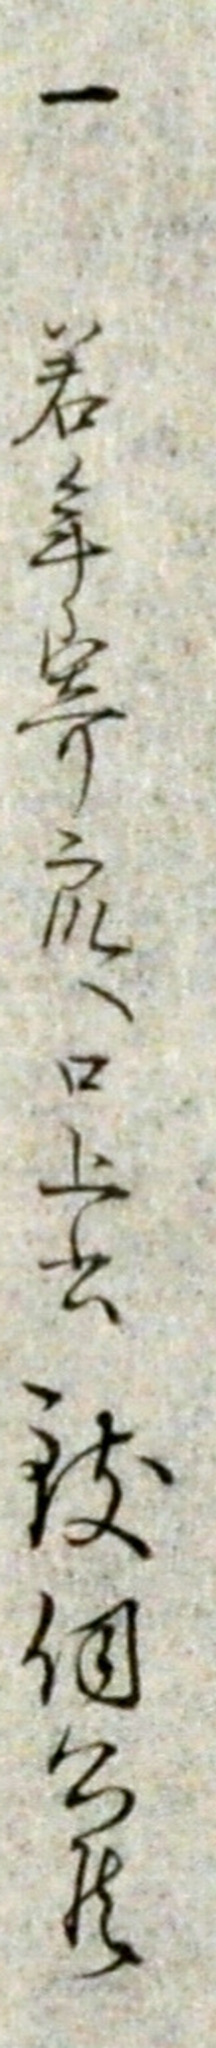一若年寄衆へ口上書致伺公候
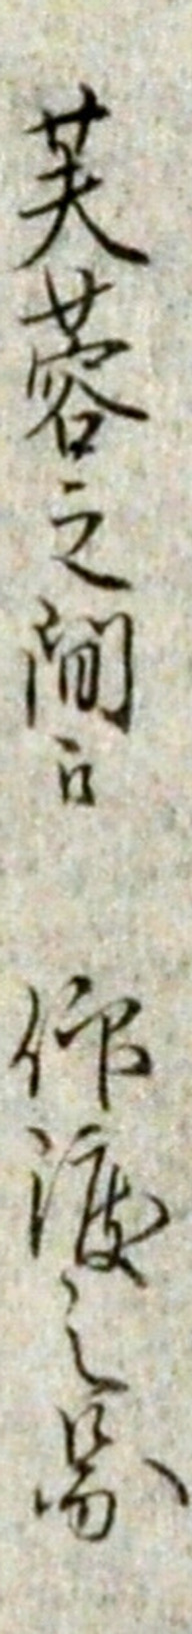芙蓉之間被仰渡之図
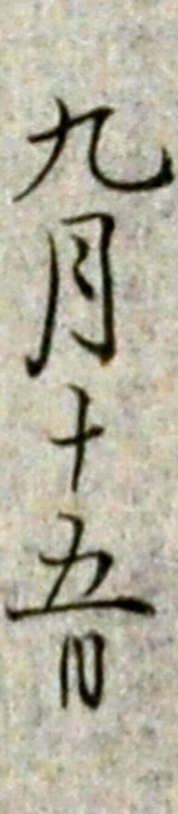九月十五日
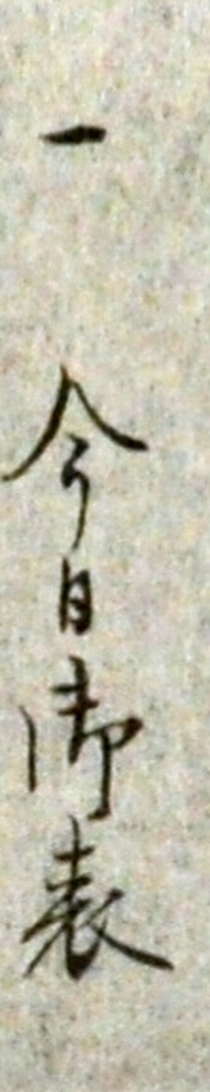一今日御表
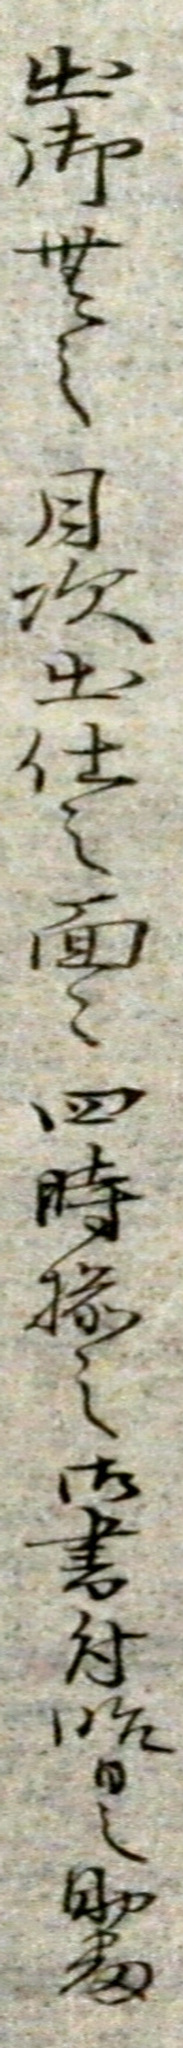出御無之月次出仕之面々四時揃之御書付昨日之助番
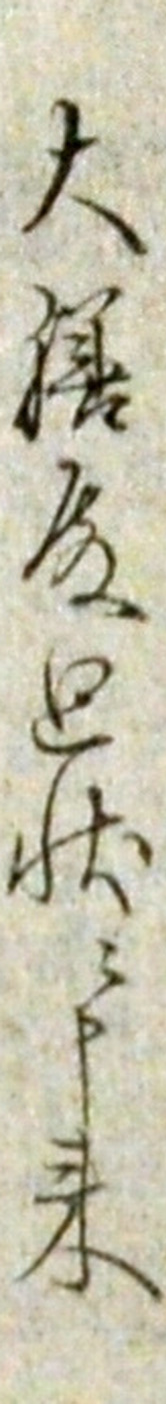大膳殿廻状ニ申来
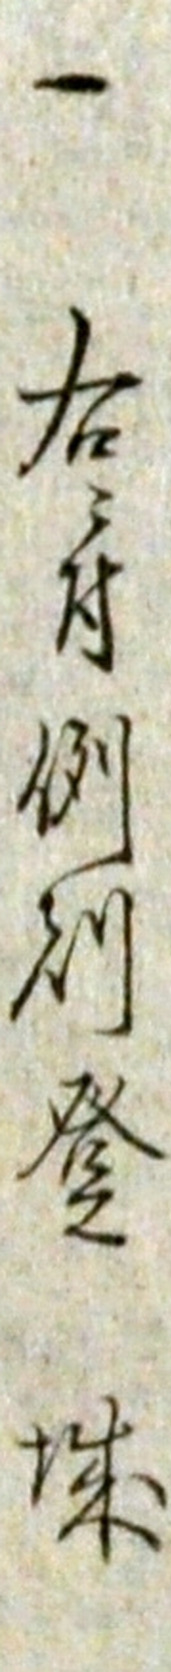一右二付例刻登城

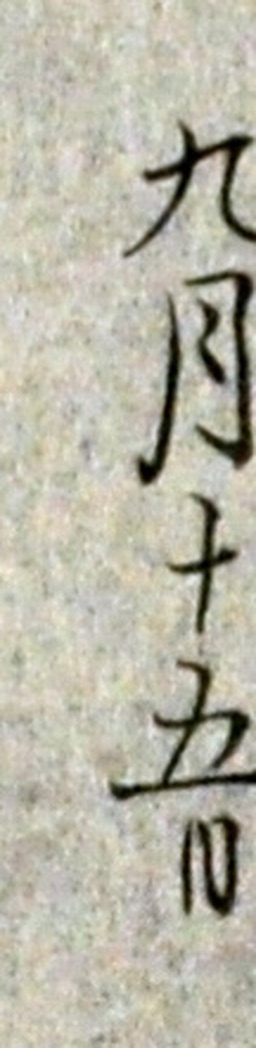九月十五日
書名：日光御名代相勤候節ノ留
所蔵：伊那市立高遠町図書館・合同会社AMANE
